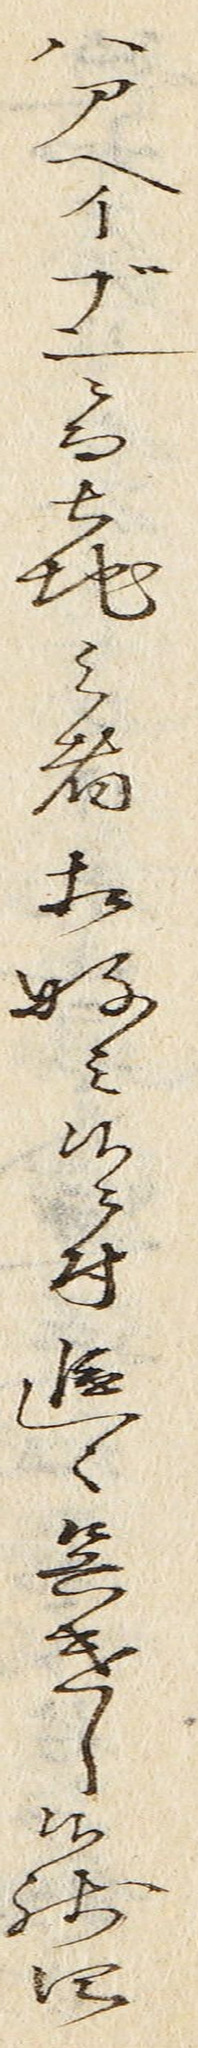ハアヘイブンに而土地之者相好み候に付追々呉遣し候残四
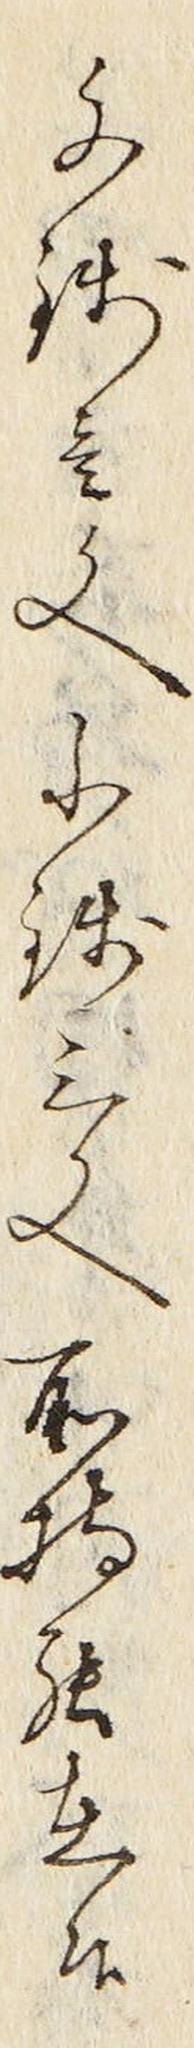文銭壱文小銭三文所持罷在候
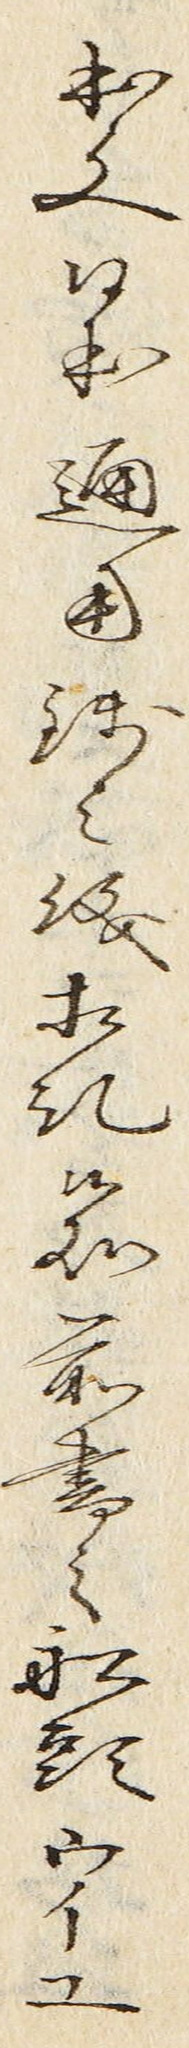本文日本通用銭儀相糺候処前書之船頭ウイユ
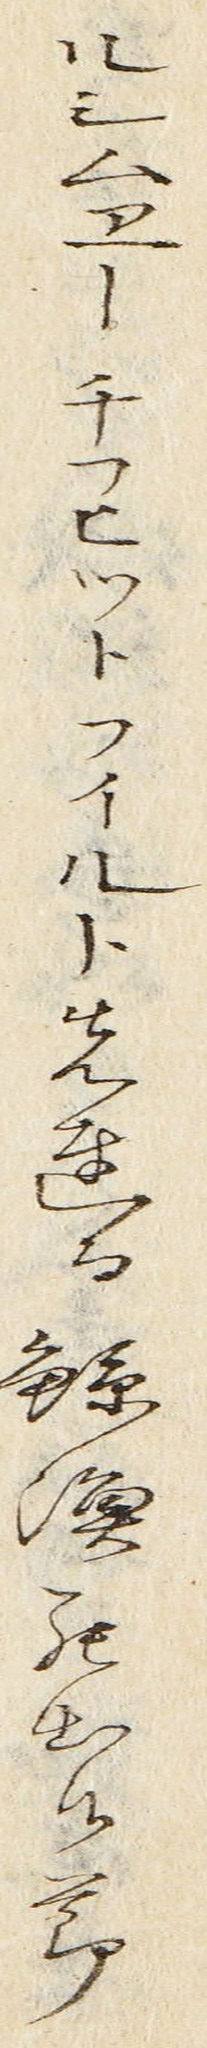ルシムエーチフヒツトフイルト先達而鯨漁罷出候節
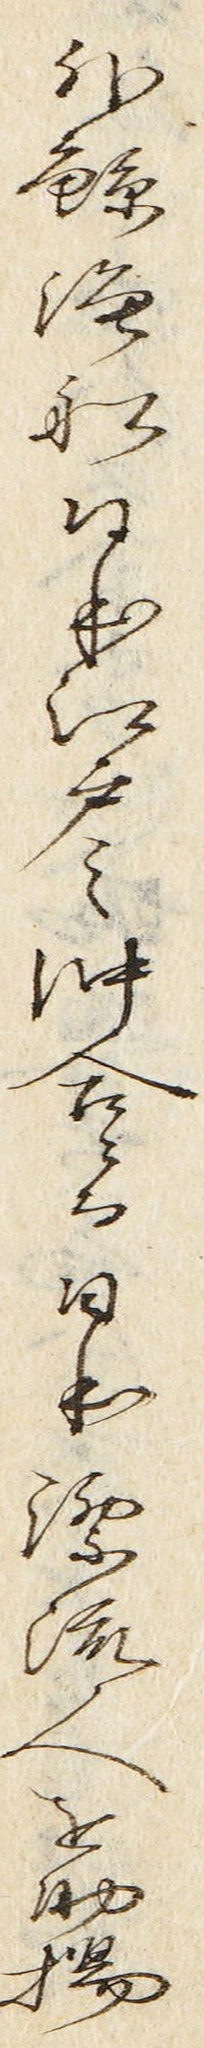外鯨漁船日本江戸之沖合に而日本漂流人を助揚
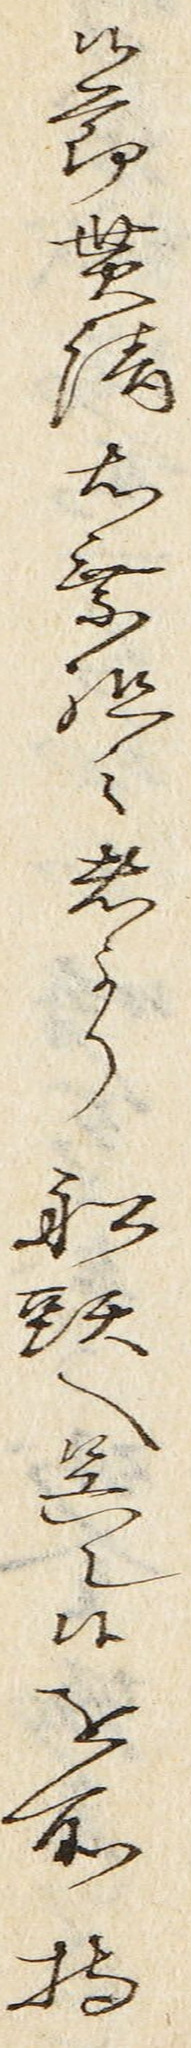候節貰請右乗組之者より船頭へ呉れ候を所持
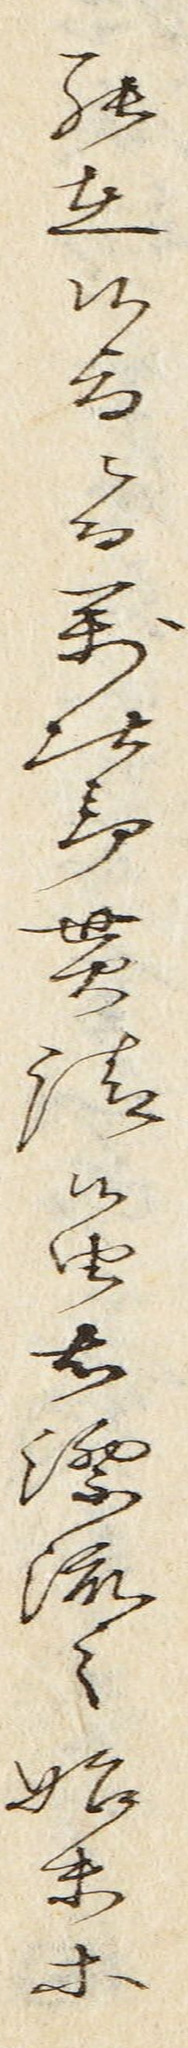罷在候旨に而万次郎貰請候由右漂流之始末等
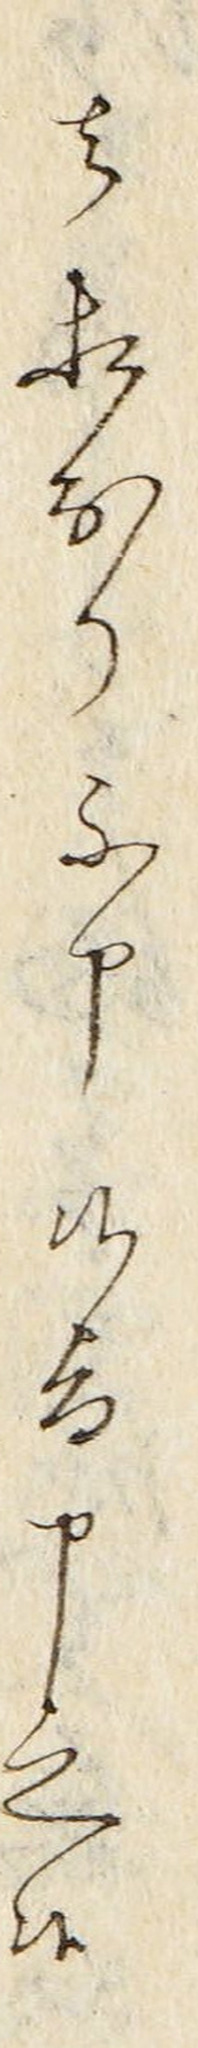は相分り不申候旨申之候
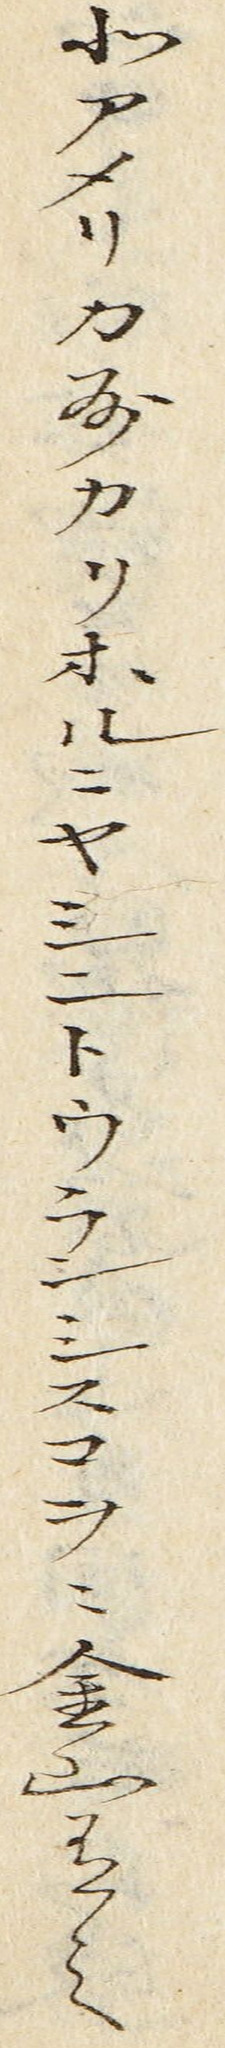北アメリカ州カリホルニヤシントウランシスコヲに金山有之

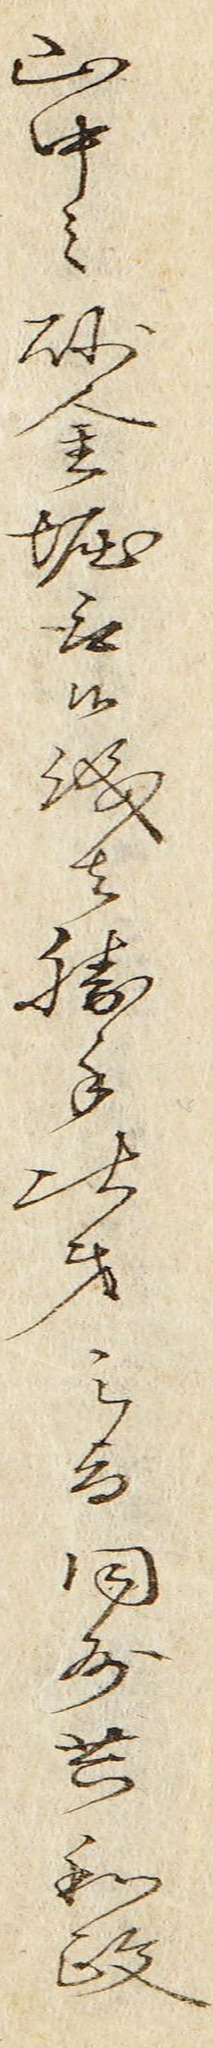山中之砂金堀取候儀は勝手次第之旨同州共和政
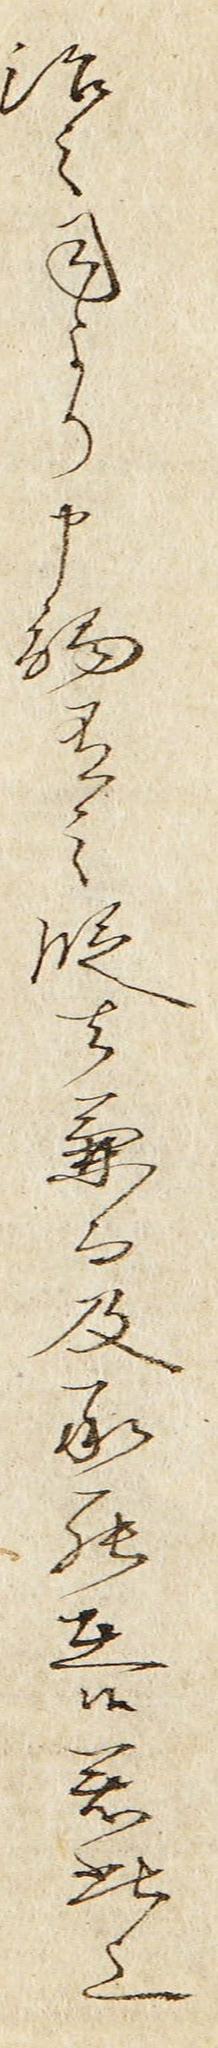治之司より申触有之段は兼而及承罷在候若此上
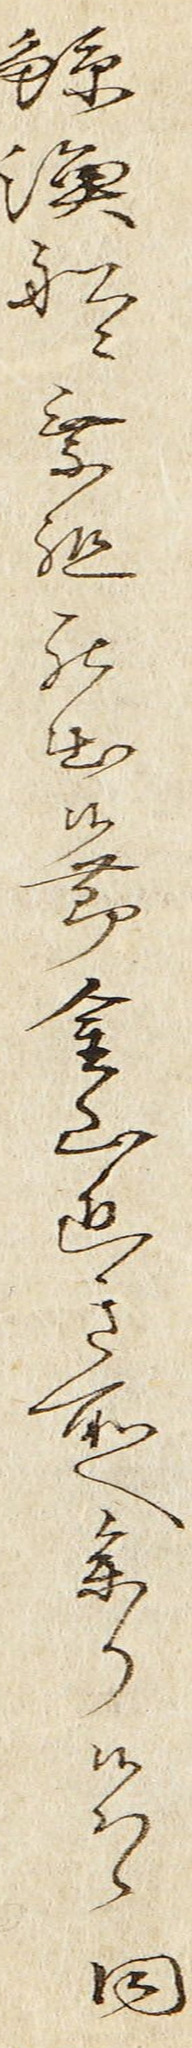鯨漁船に乗組罷出候節金山近き所へ参り候はゝ同
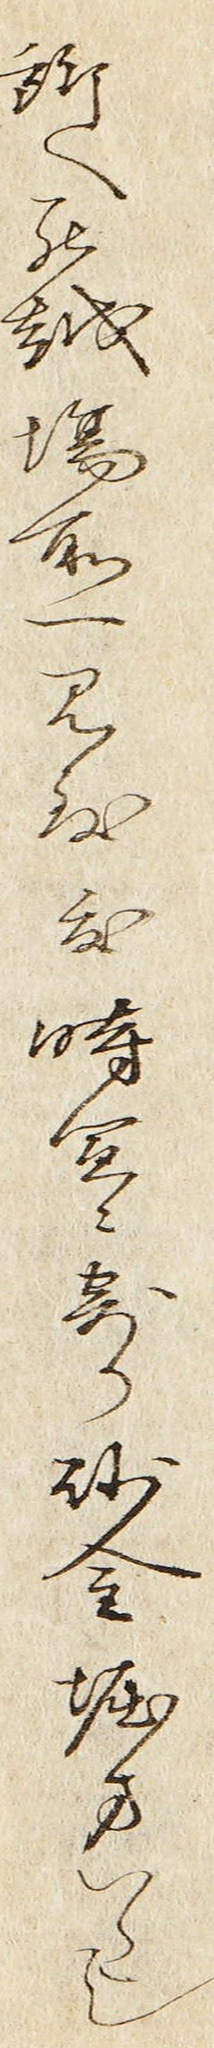所へ罷越場所一見致度時宜に寄り砂金堀方いたし
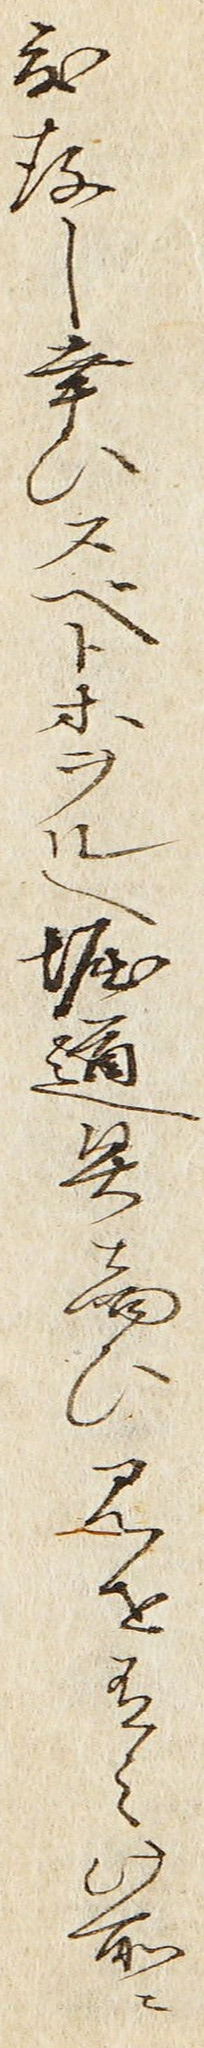度存し幸ひヌベトホヲルへ堀道具商ひみせ有之此所に
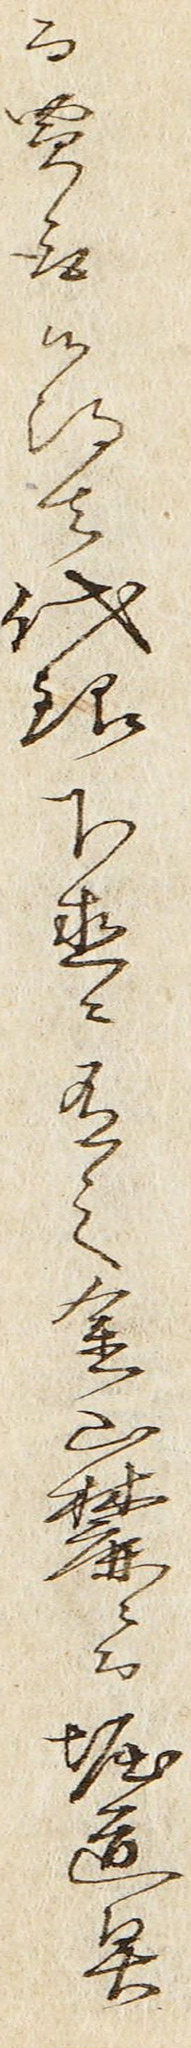而買取候得は代銀下直に有之金山麓に而堀道具
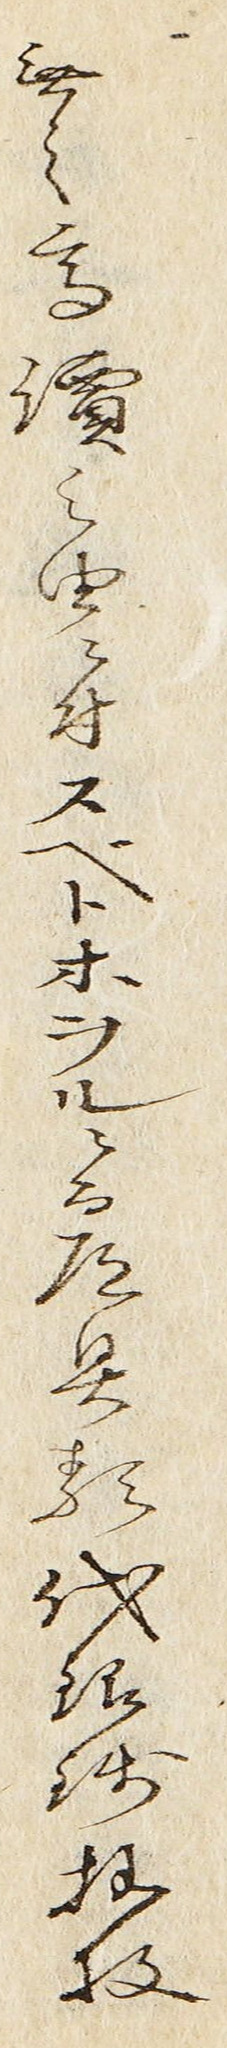無之高価之由に付ヌベトホヲルに而道具類代銀銭拾枚
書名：土佐中浜万次郎漂流記
